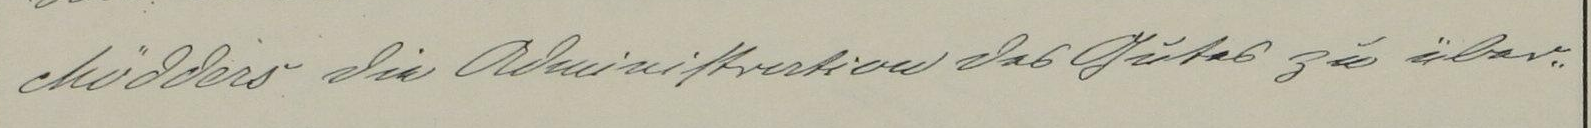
Mödders die Administration des Gutes zu über-
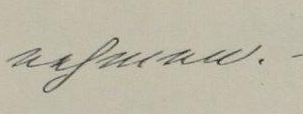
nehmen.
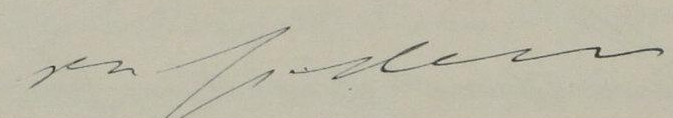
in fidem
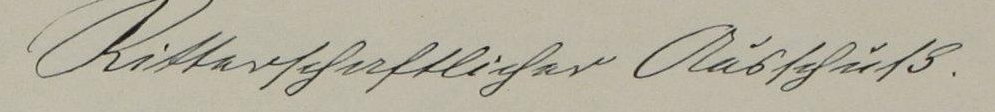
Ritterschaftlicher Ausschuß.
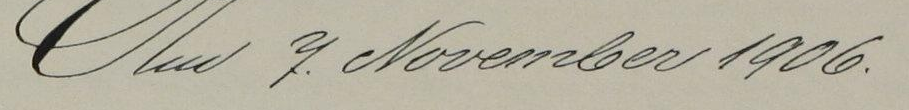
Am 7. November 1906.
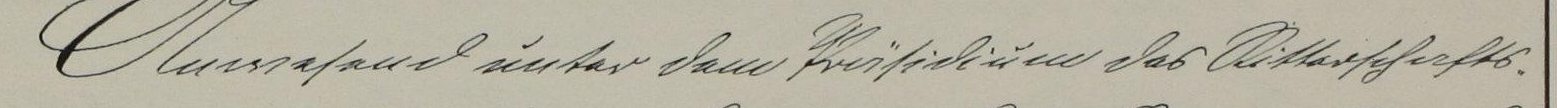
Anwesend unter dem Präsidium des Ritterschafts-
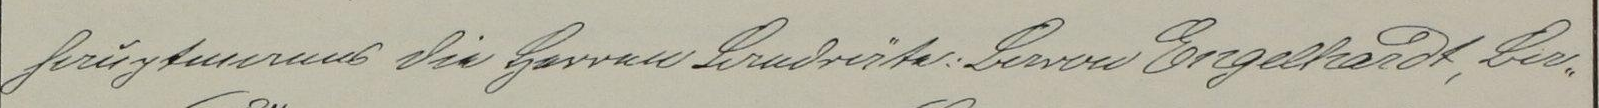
hauptmanns die Herren Landräte: Baron Engelhardt, Ba-
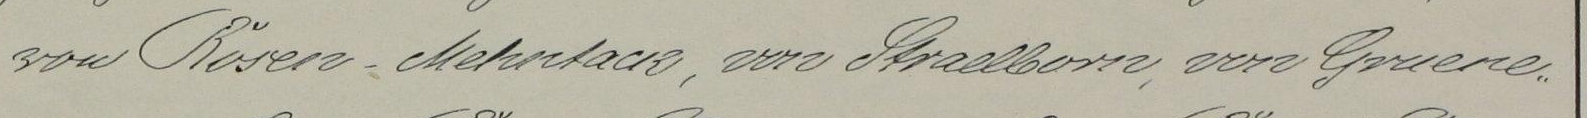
ron Rosen-Mehntack, von Straelborn, von Gruene-
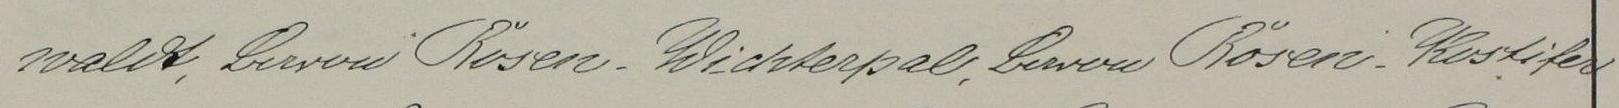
waldt, Baron Rosen-Wichterpal, Baron Rosen-Kostifer
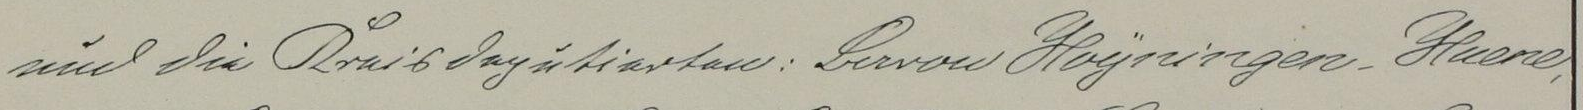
und die Kreisdeputierten: Baron Hoyningen-Huene,
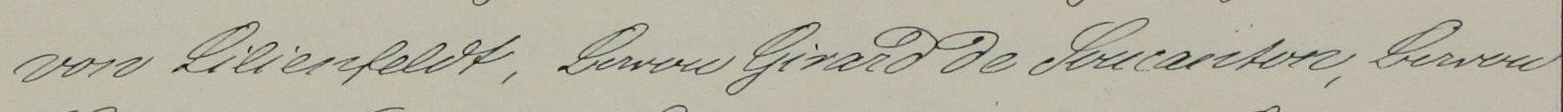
von Lilienfeldt, Baron Girard de Soucanton, Baron
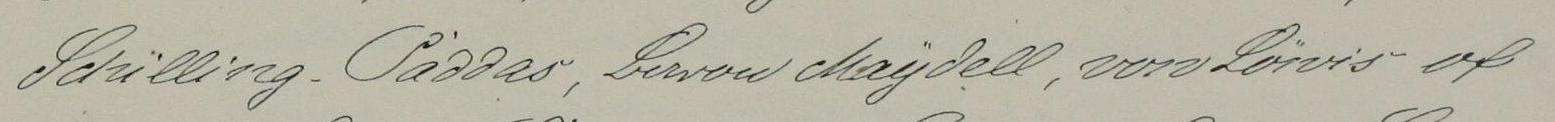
Schilling-Paddas, Baron Maydell, von Löwis of
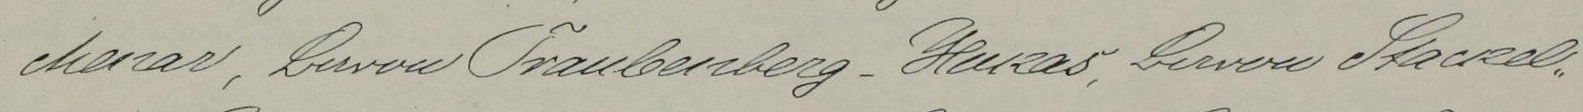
Menar, Baron Traubenberg-Hukas, Baron Stackel-
